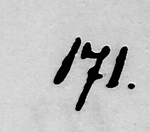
1.
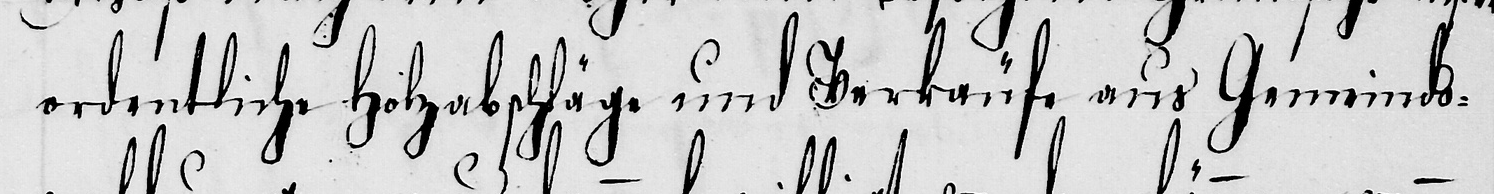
ordentliche Holzabschläge und Verkäufe aus Gemeinds¬
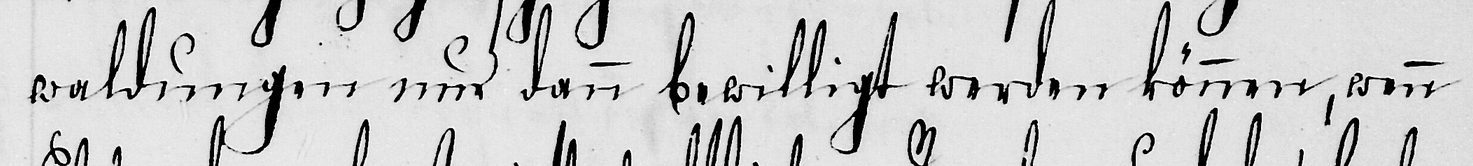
waldungen nur dann bewilligt werden können, wenn
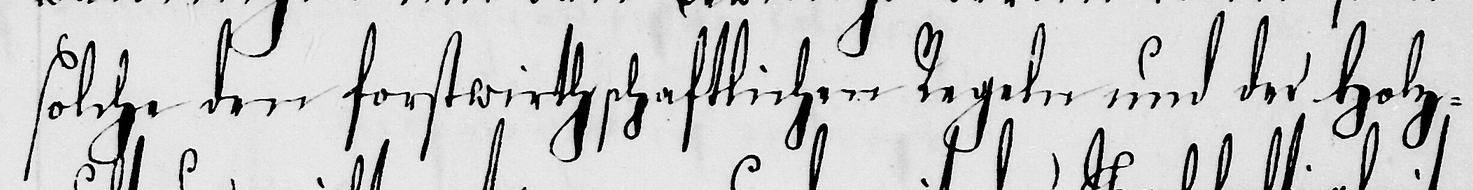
solche den forstwirthschaftlichen Regeln und der Holz¬
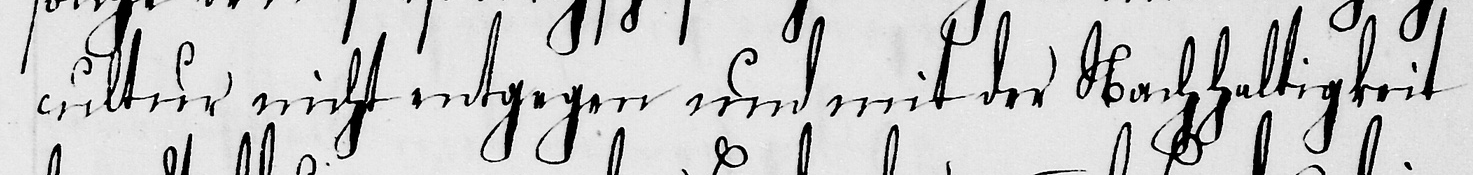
cultur nicht entgegen und mit der Nachhaltigkeit
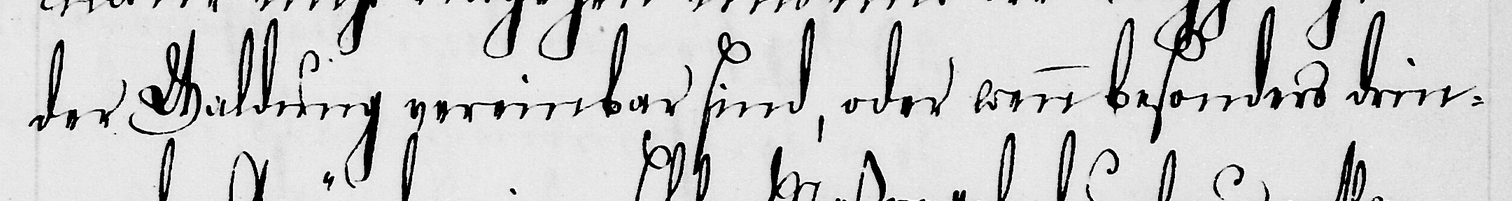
der Waldung vereinbar sind, oder wenn besonders drin¬
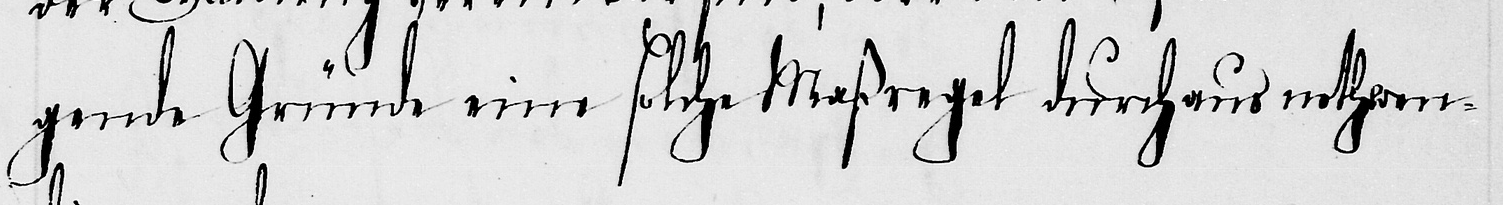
gende Gründe eine solche Maßregel durchaus nothwen¬
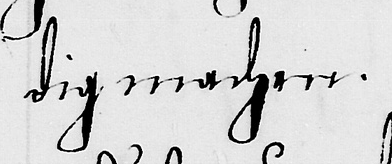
dig machen.
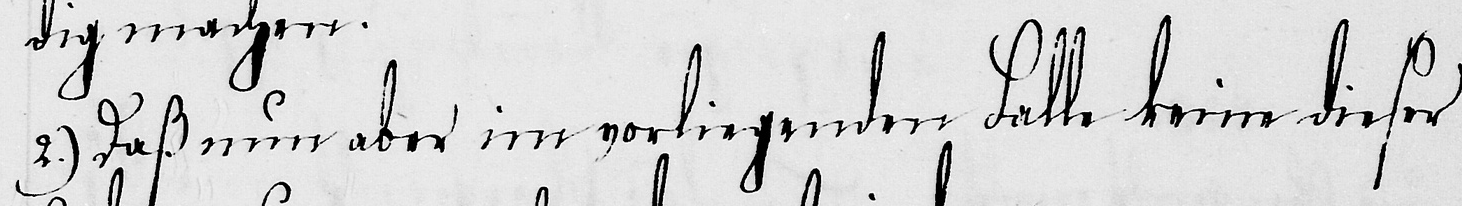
2.) Daß nun aber im vorliegenden Falle keine dieser
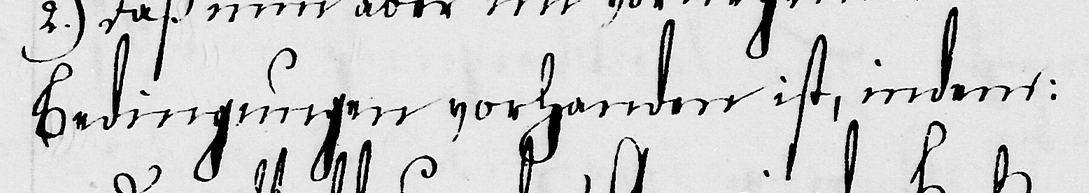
Bedingungen vorhanden ist, indem:
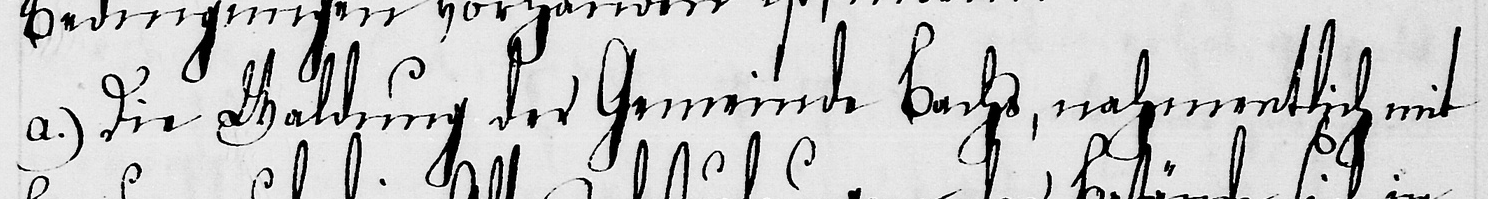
a.) Die Waldung der Gemeinde Bachs, nahmentlich mit
